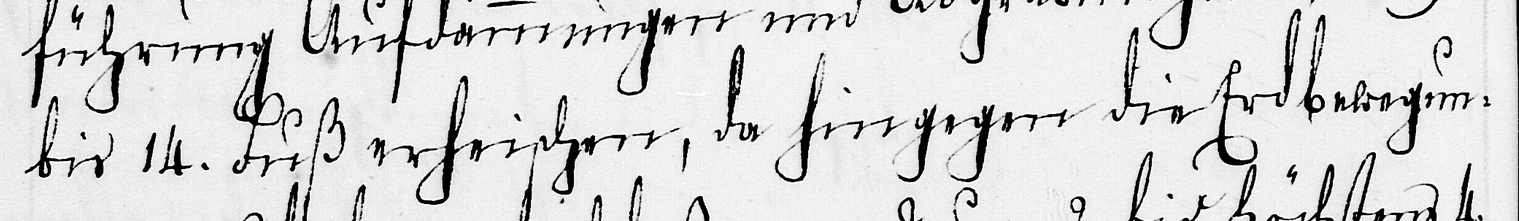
bis 14. Fuß erheischen, da hingegen die Erdbewegun¬
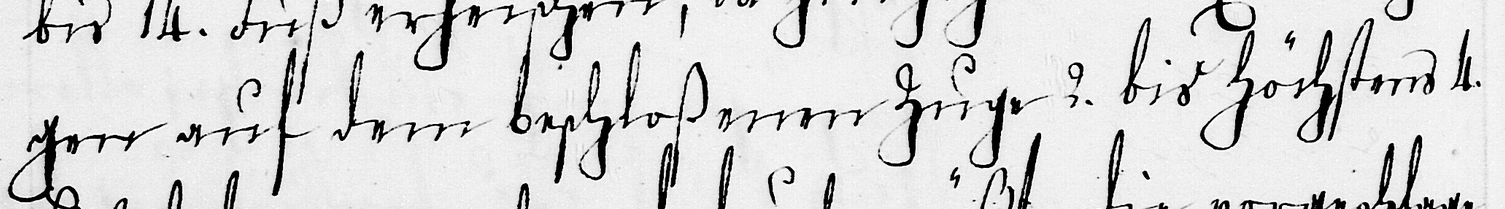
gen auf dem beschloßenen Zuge 2. bis höchstens 4.
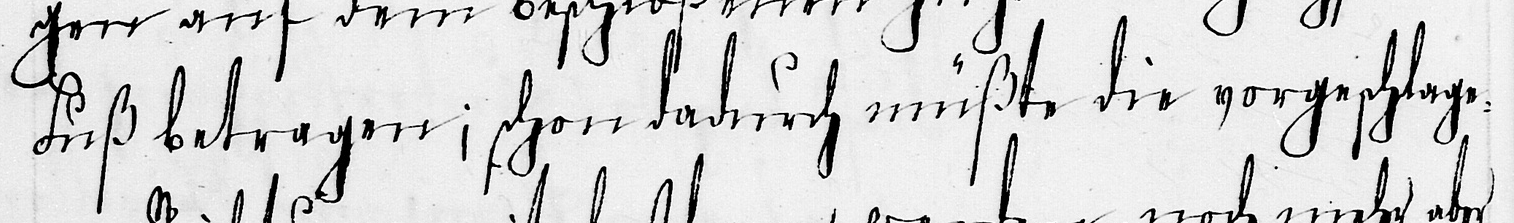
Fuß betragen; schon dadurch müßte die vorgeschlag¬
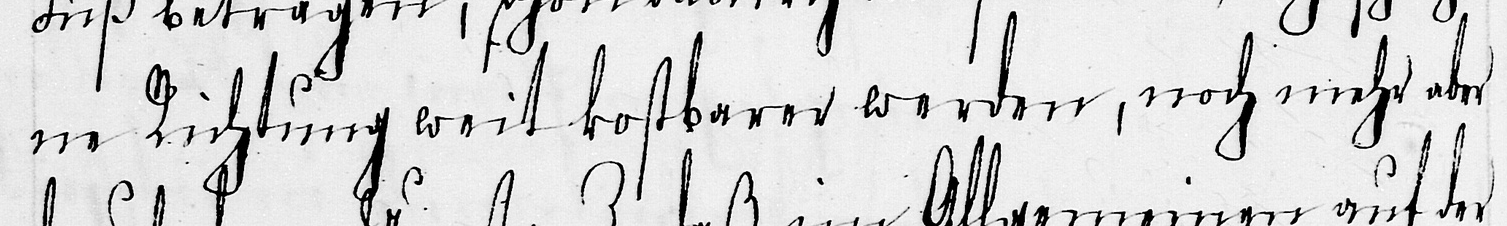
ene Richtung weit kostbarer werden, noch mehr aber
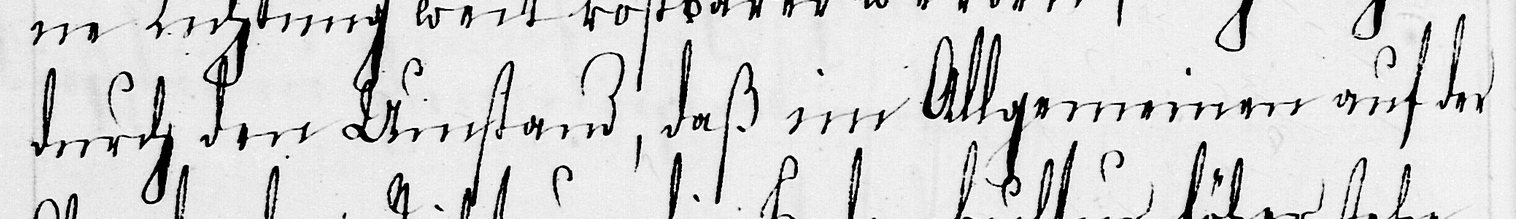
durch den Umstand, daß im Allgemeinen auf der
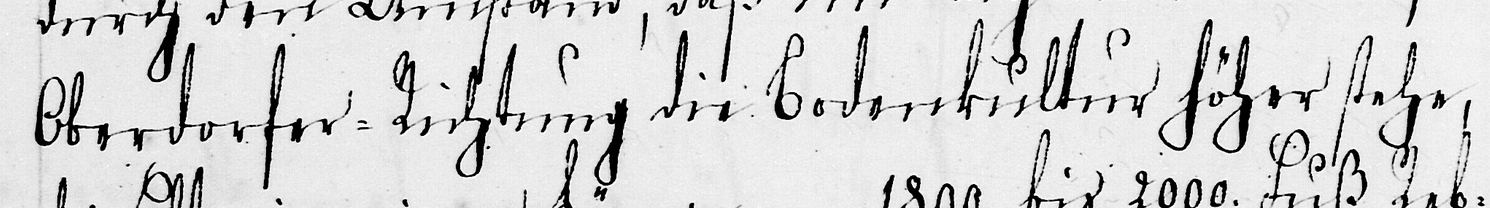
Oberdorfer-Richtung die Bodenkultur höher steh¬
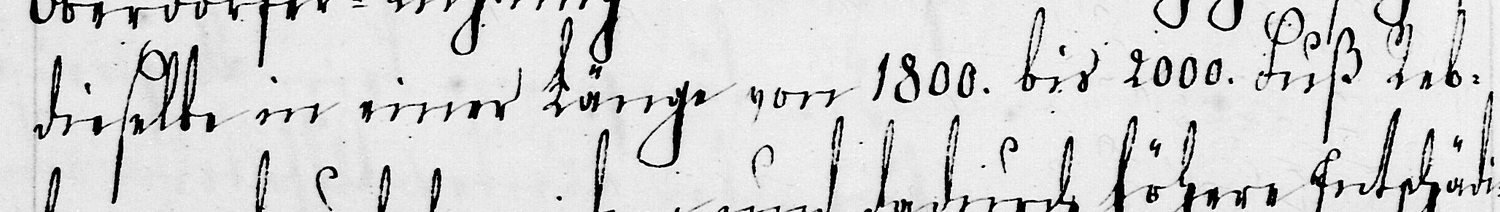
dieselbe in einer Länge von 1800. bis 2000. Fuß Reb¬
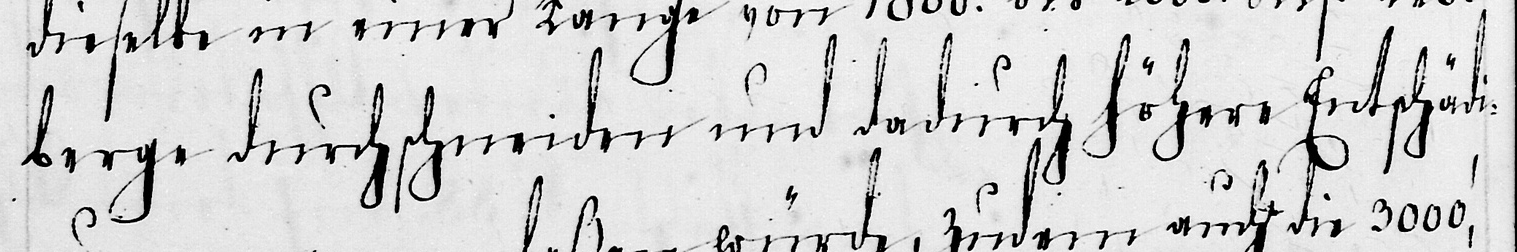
berge durchschneiden und dadurch höhere Entschäd¬
